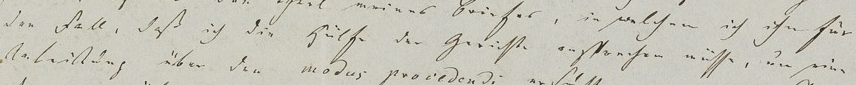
den Fall, daß ich die Hülfe der Gerichte ansprechen müsse, um eine
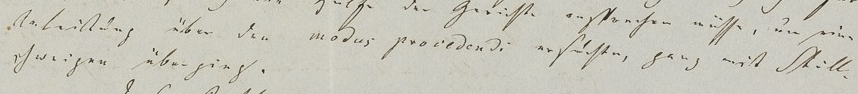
Anleitung über den modus procedendi ersuchte, ganz mit Still-
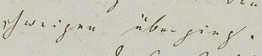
schweigen überging.
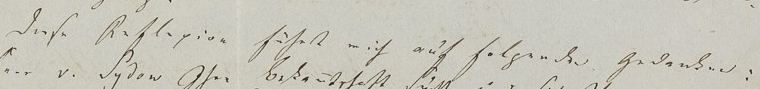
Diese Reflexion führt mich auf folgende Gedanken:
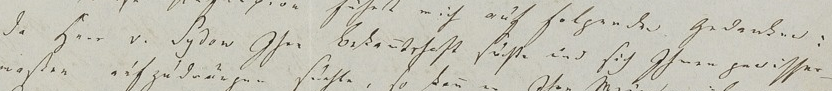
Da Herr v. Sydow Ihre Bekanntschaft suchte und sich Ihnen gewisser-
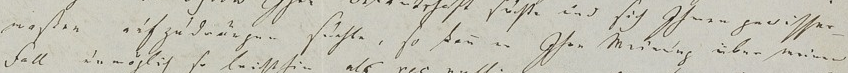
maßen aufzudrängen suchte, so kann er Ihre Meinung über meinen
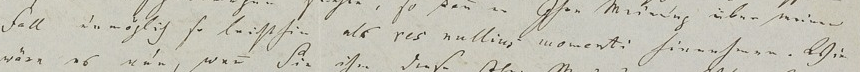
Fall unmöglich so leichthin als res nullius momenti hinnehmen. Wie
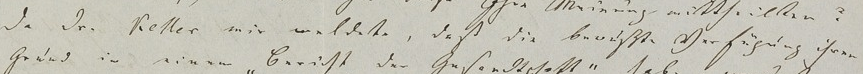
Da Dr. Keller mir meldete, daß die bewußte Verfügung ihren
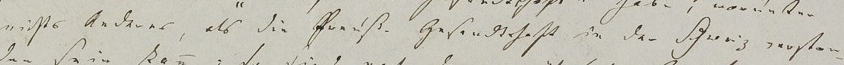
nichts Anderes, als die Preuß. Gesandtschaft in der Schweiz verstan-
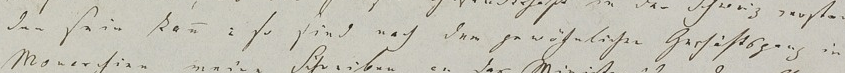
den sein kann: so sind nach dem gewöhnlichen Geschäftsgang in
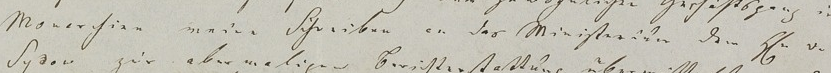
Monarchien meine Schreiben an das Ministerium dem Herrn v.
